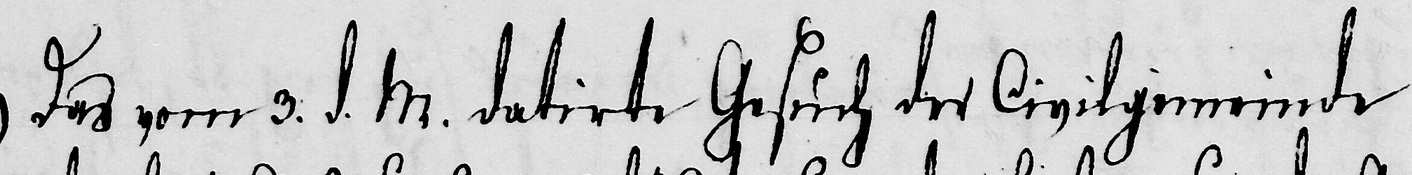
Das vom 3. d. M. datirte Gesuch der Civilgemeinde
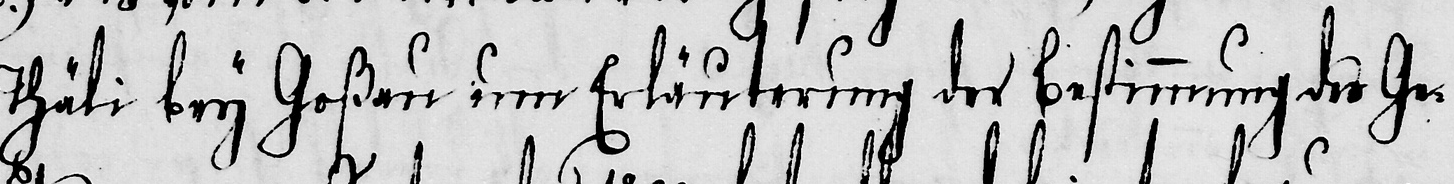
Thäli bey Goßau um Erläuterung der Bestimmung des Ge¬
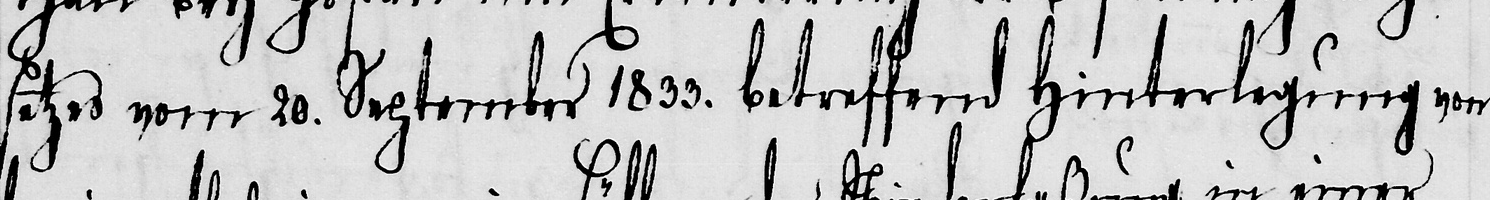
etzes vom 20. September 1833. betreffend Hinterlegung von
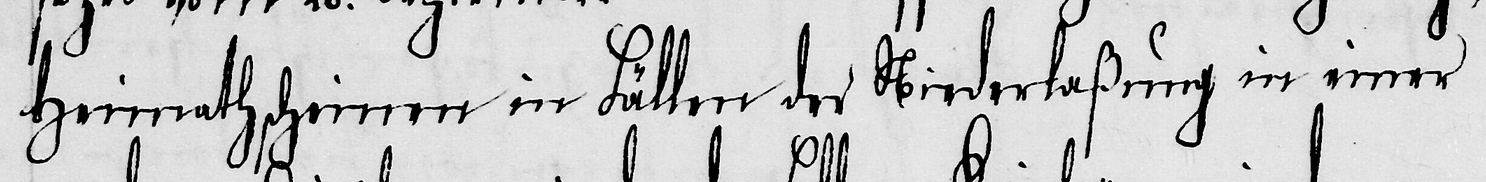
Heimathscheinen in Fällen der Niederlaßung in einer
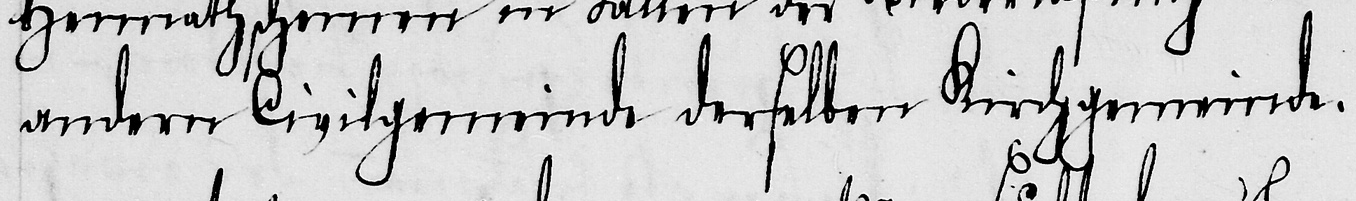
andern Civilgemeinde derselben Kirchgemeinde.
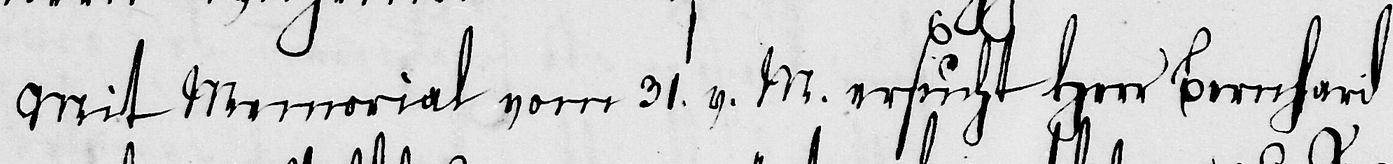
Mit Memorial vom 31. v. M. ersucht Herr Bernhard
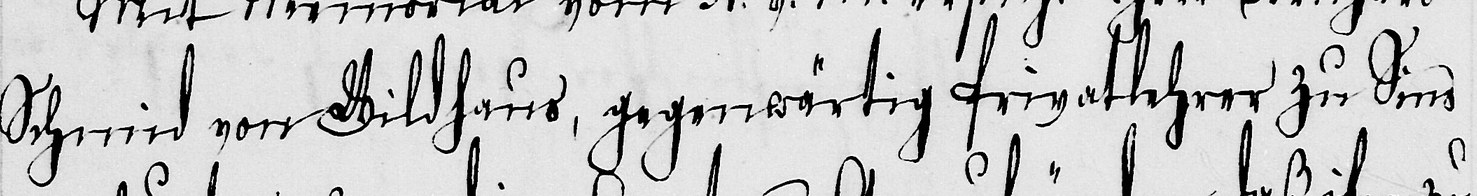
Schmid von Wildhaus, gegenwärtig Privatlehrer zu Sins
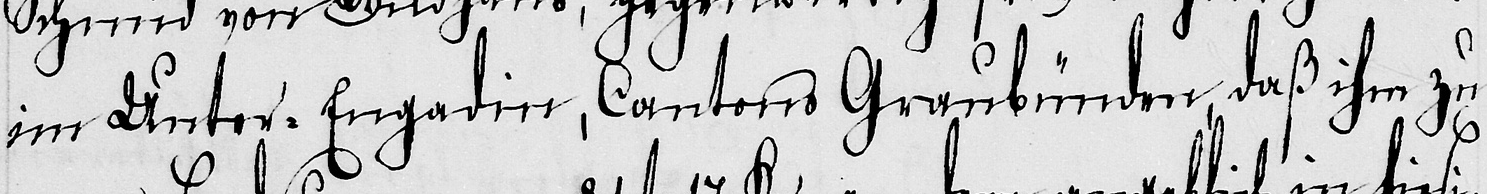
im Unter-Engadin, Cantons Graubünden, daß ihm zu
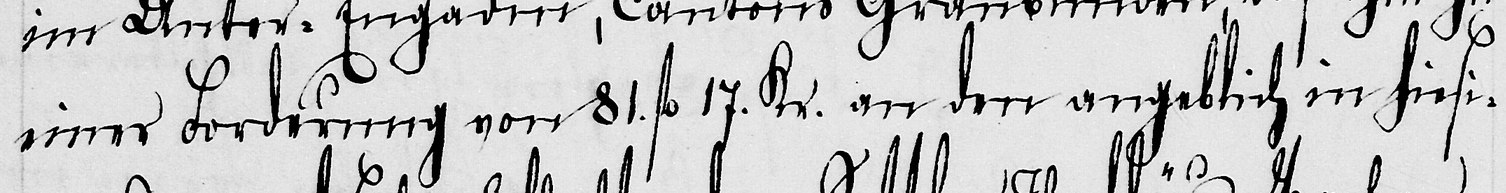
einer Forderung vom 81. fl. 17. Kr. an den angeblich in hiesi¬
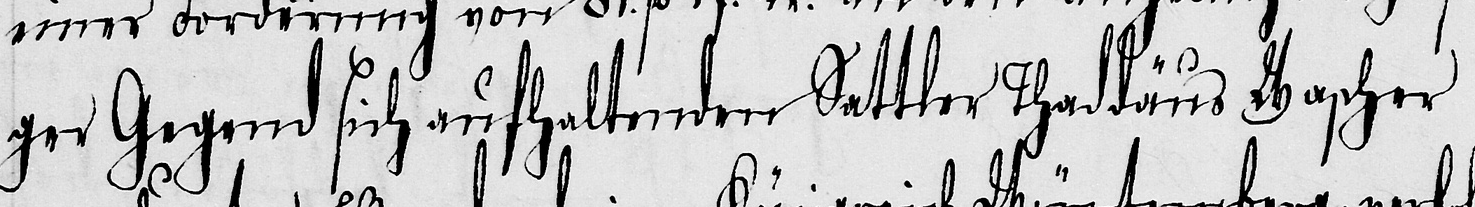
ger Gegend sich aufhaltenden Sattler Thaddäus Wascher
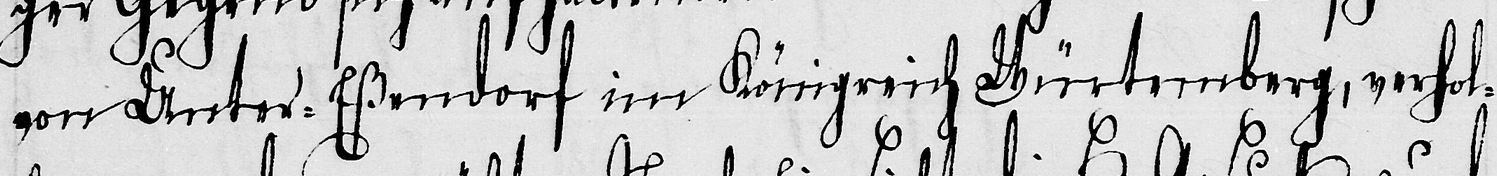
von Unter-Eßendorf im Königreich Würtemberg, verhol¬
